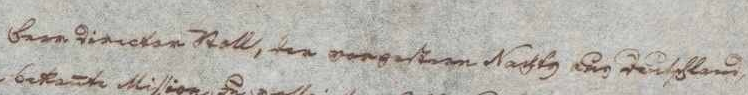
Herr Director Stoll, der vorgestern Nachts aus Deutschland,
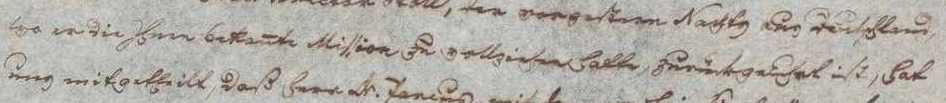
wo er die Ihnen bekannte Mission zu vollziehen hatte, zurückgekehrt ist, hat
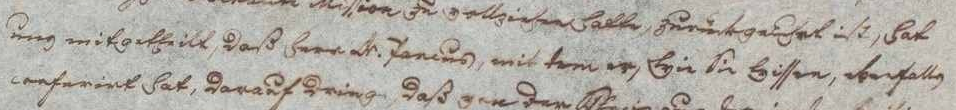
uns mitgetheilt, daß Herr Dr. Parcus, mit dem er, wie Sie wissen, ebenfalls
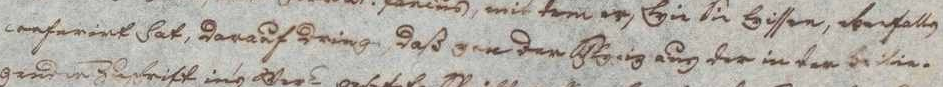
conferirt hat, darauf dringe, daß von der Schweiz aus der in der beilie-
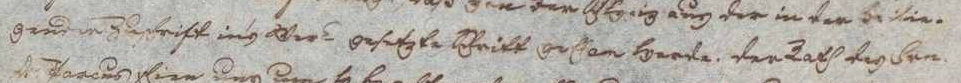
genden Zuschrift in's Werk gesetzte Schritt gethan werde. Der Rath des Hrn.
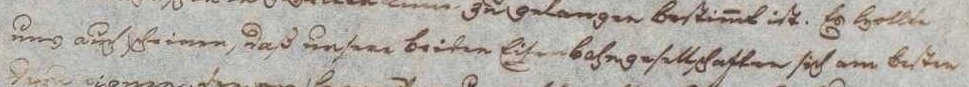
uns auch scheinen, daß unsere beiden Eisenbahngesellschaften sich am besten
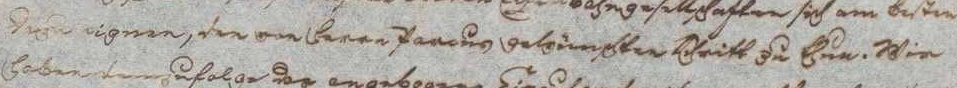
dazu eignen, den von Herrn Parcus gewünschten Schritt zu thun. Wir
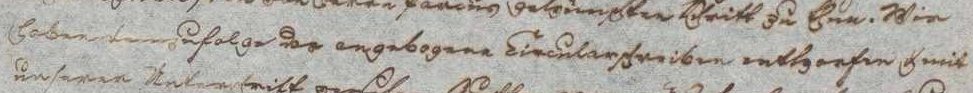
haben demzufolge das angebogene Circularschreiben entworfen & mit
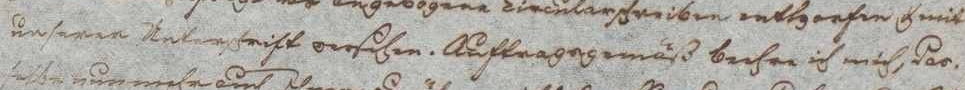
unserer Unterschrift versehen. Auftragsgemäß beehre ich mich, das-
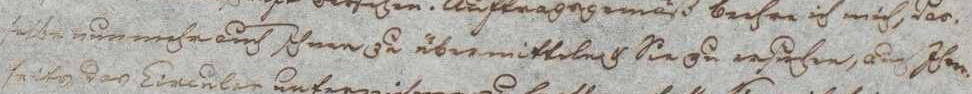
selbe nunmehr auch Ihnen zu überrmitteln & Sie zu ersuchen, auch Ihrer-
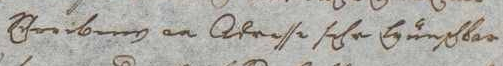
Schreibens an Adresse sehr wünschbar
